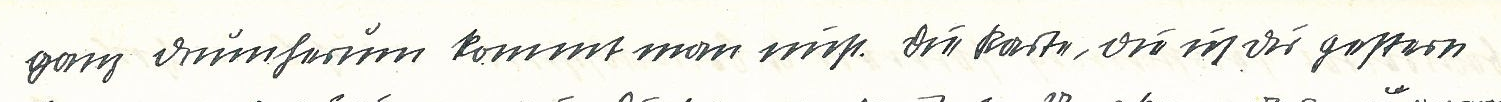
ganz drumherum kommt man nicht. Die Karte, die ich dir gestern
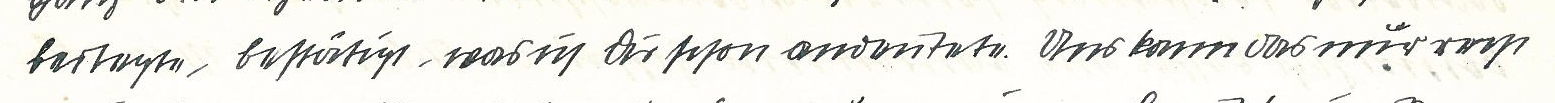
beilegte, bestätigt, was ich dir schon andeutete. Uns kann das nur recht
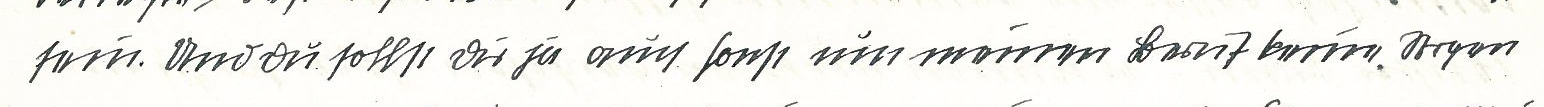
sein. Und Du sollst Dir ja auch sonst um meinen Beruf keine Sorgen
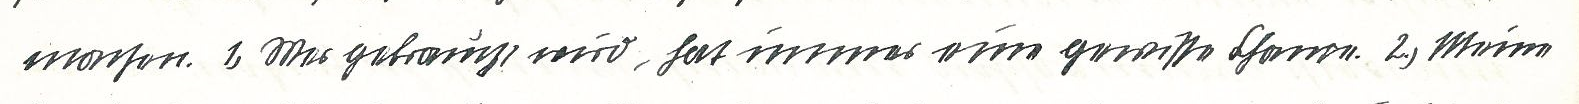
machen. 1) Wer gebraucht wird, hat immer eine gewisse Chance. 2) Meine
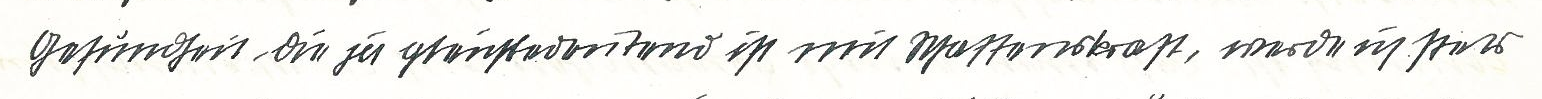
Gesundheit, die ja gleichbedeutend ist mit Schaffenskraft, werde ich stets
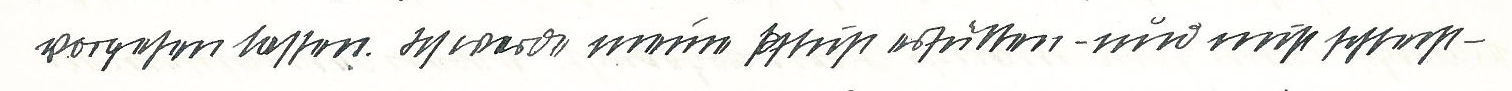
vorgehen lassen. Ich werde meine Pflicht erfüllen – und nicht schlecht –
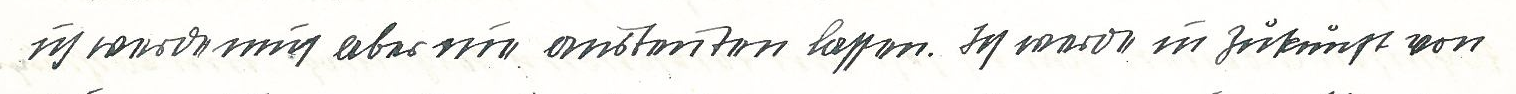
ich werde mich aber nie ausbeuten lassen. Ich werde in Zukunft von
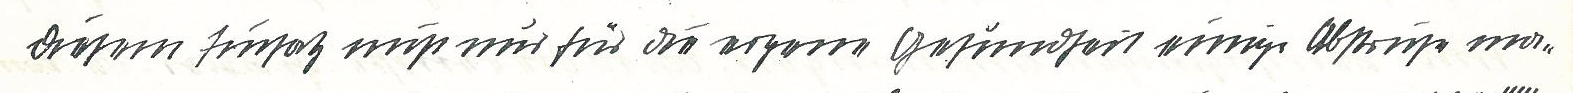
diesem Einsatz nicht nur für die eigene Gesundheit einige Abstriche ma¬
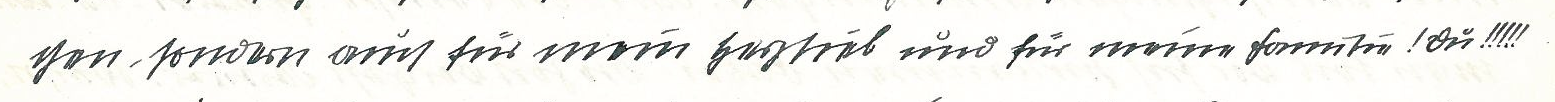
chen, sondern auch für mein Herzlieb und für meine Familie! Du!!!!!
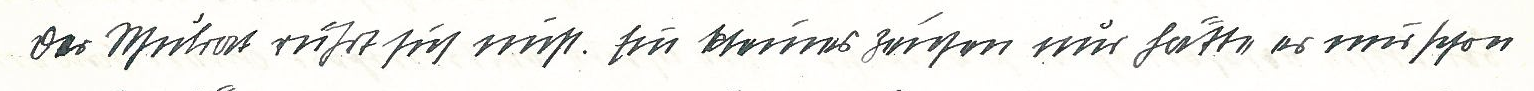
Der Schulrat rührt sich nicht. Ein kleines Zeichen nur hätte er mir schon
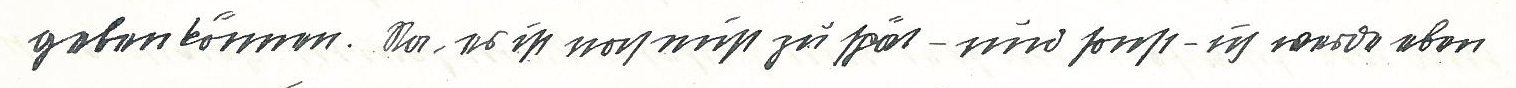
geben können. Na, es ist noch nicht zu spät – und sonst – ich werde eben
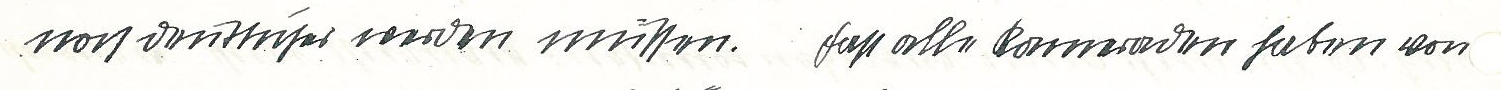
noch deutlicher werden müssen. Fast alle Kameraden haben von
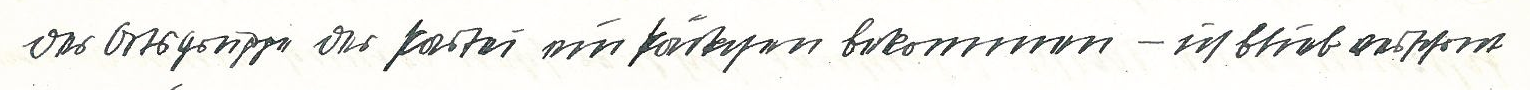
der Ortsgruppe der Partei ein Pöstchen bekommen – ich blieb verschont
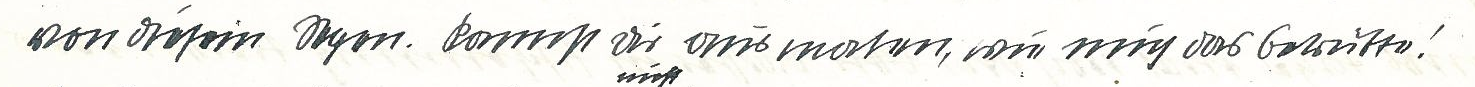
von diesem Segen. Kannst Dir aus malen wie mich das berührte!
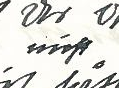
nicht
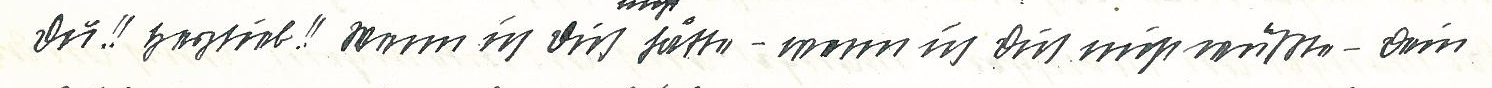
Du!! Herzlieb!! Wenn ich Dich hätte – wenn ich Dich nicht wüßte – Dein
